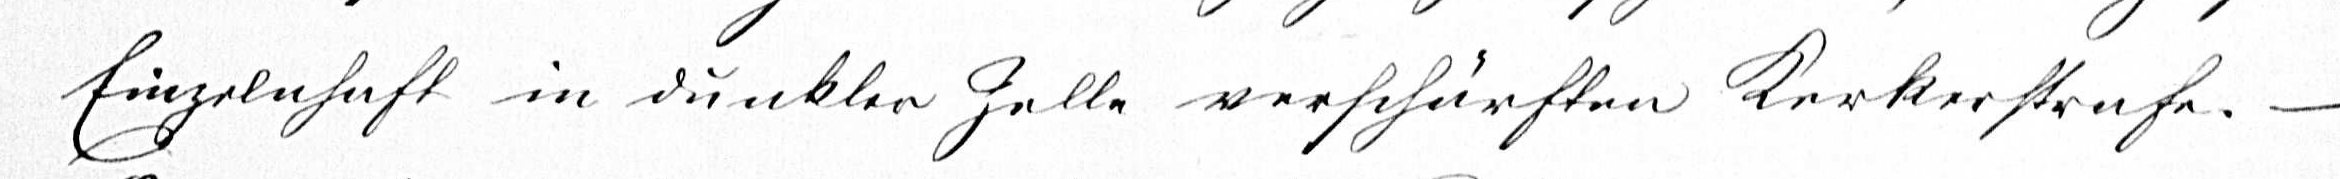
Einzelnhaft in dunkler Zelle verschärften Kerkerstrafe.-
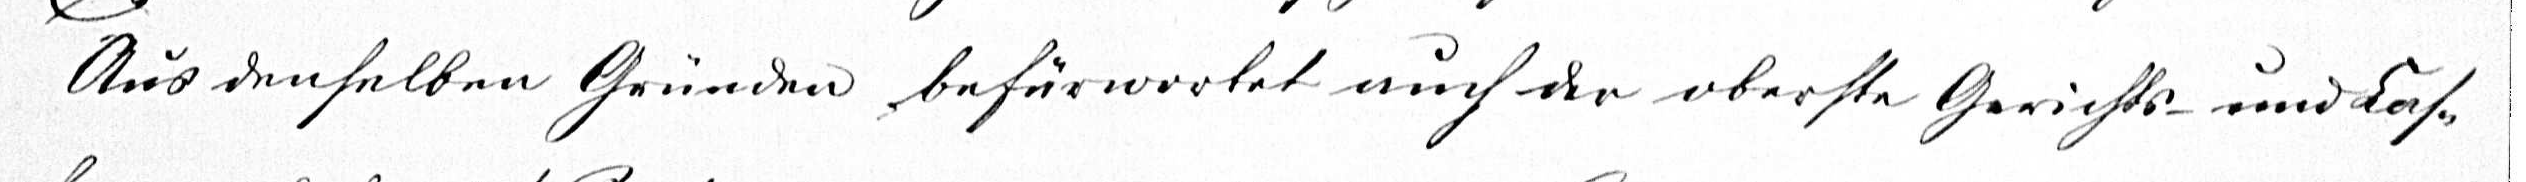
Aus denselben Gründen befürwortet auch der oberste Gerichts- und Cas¬
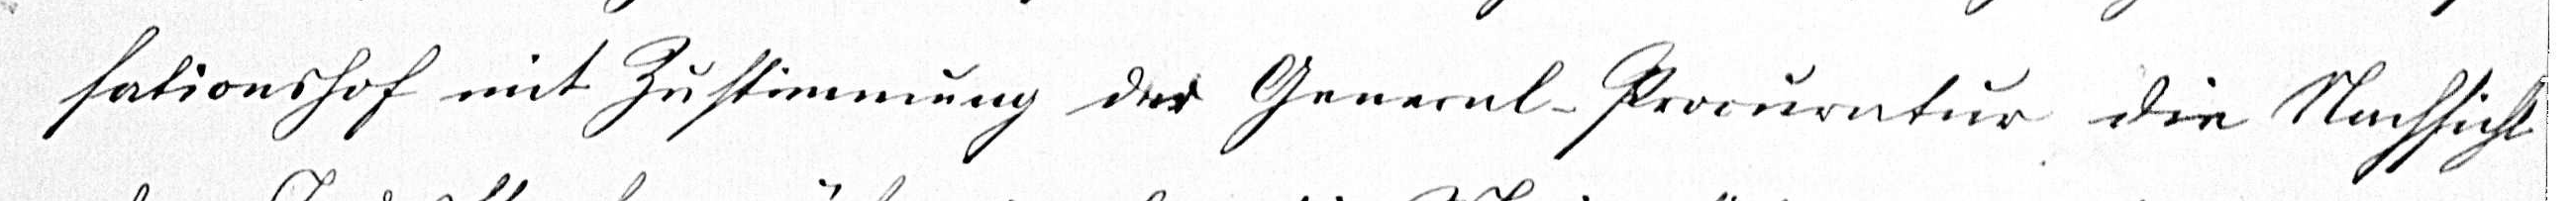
sationshof mit Zustimmung der General-Procuratur die Nachsicht
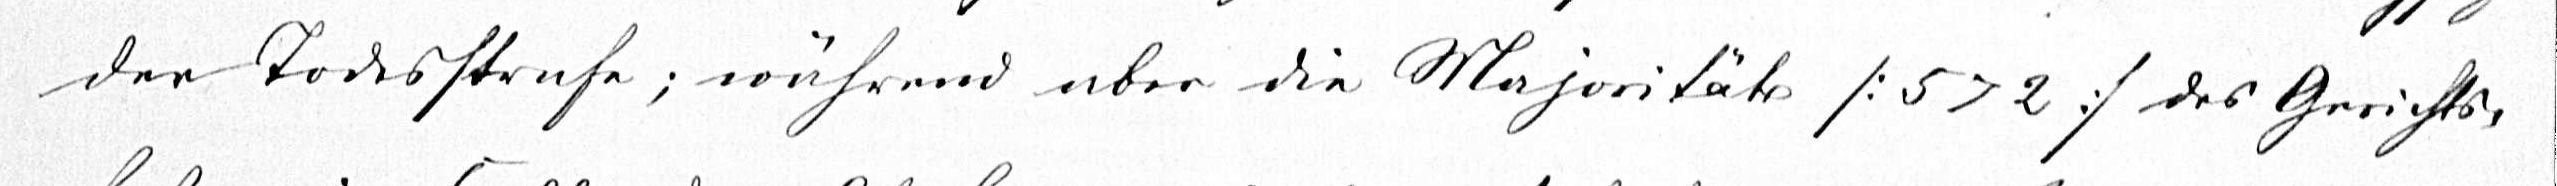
der Todesstrafe; während aber die Majorität /: 572 :/ des Gerichts¬
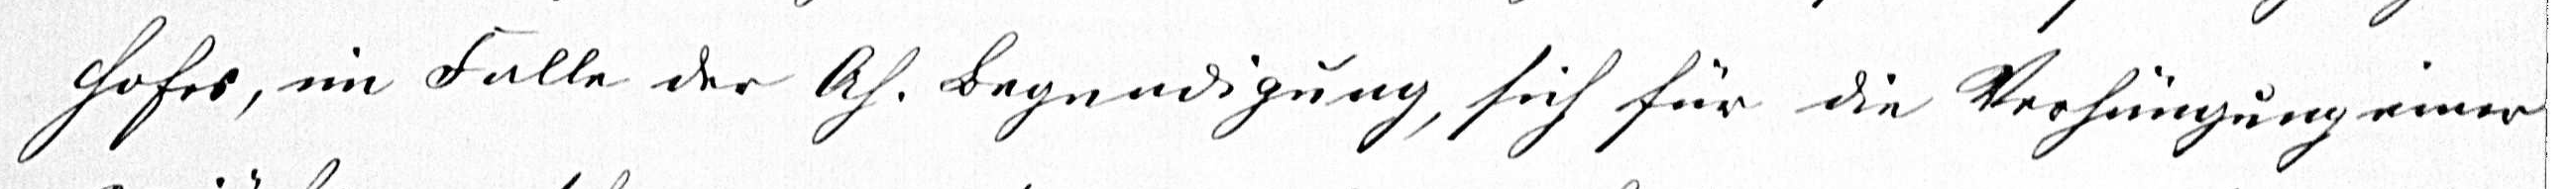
hofes, im Falle der Ah. Begnadigung, sich für die Verhängung einen
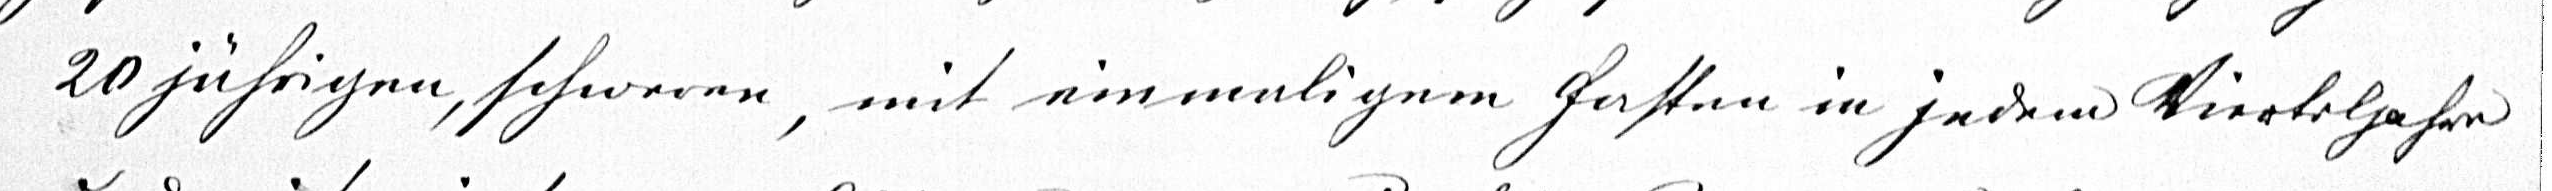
20 jährigen, schweren, mit einmaligem Fasten in jedem Vierteljahre
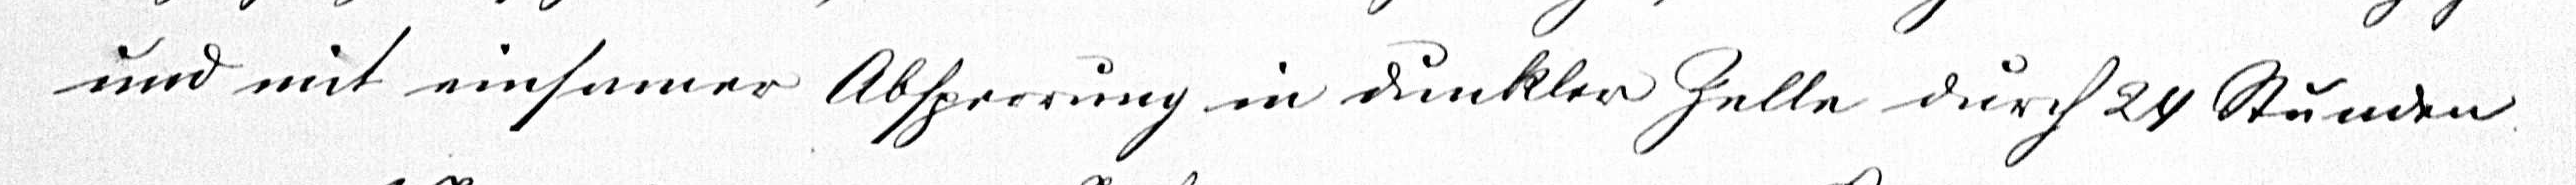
und mit einsamer Absperrung in dunkler Zelle durch 24 Stunden
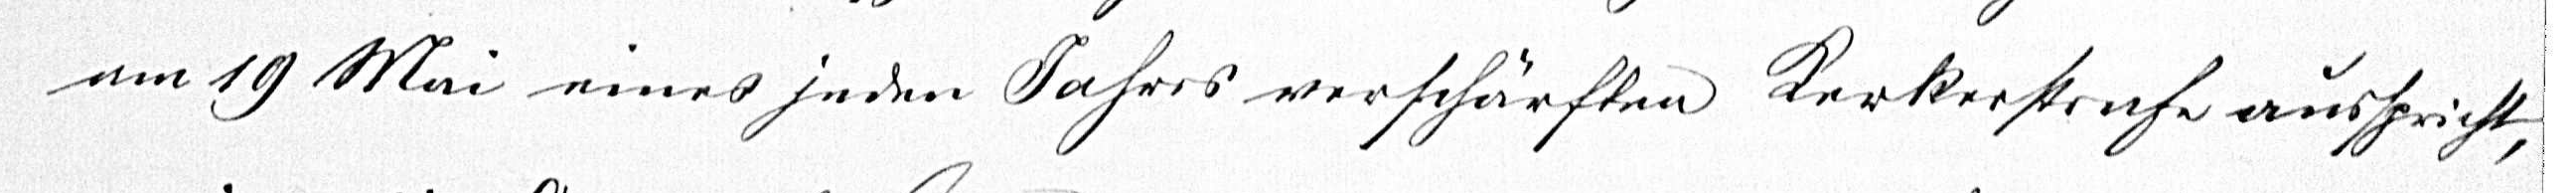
am 19 Mai eines jeden Jahres verschärften Kerkerstrafe ausspricht,
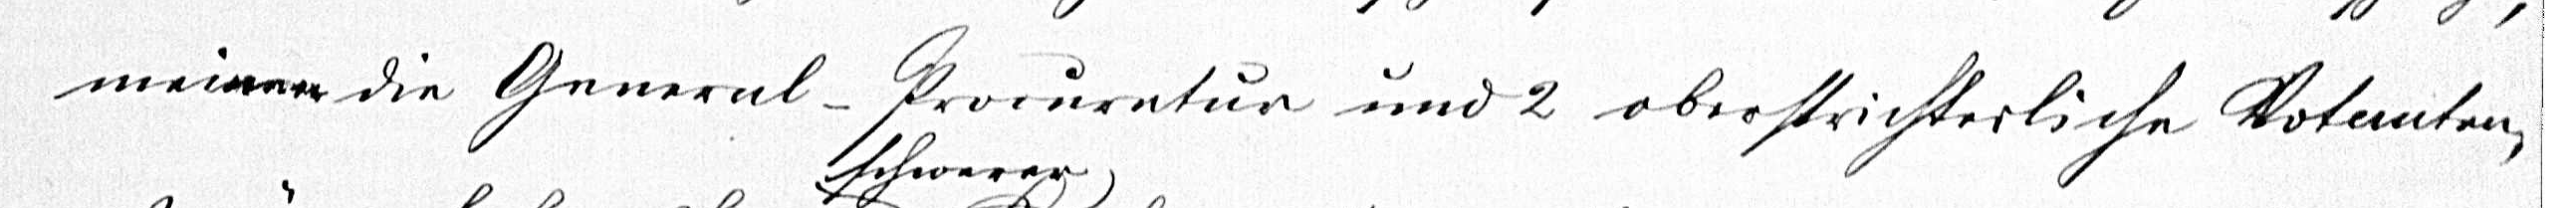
meinen die General-Procuratur und 2 oberstrichterliche Votanten,
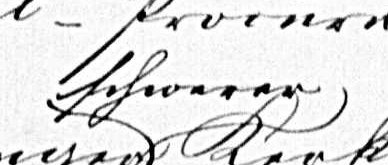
schwerer
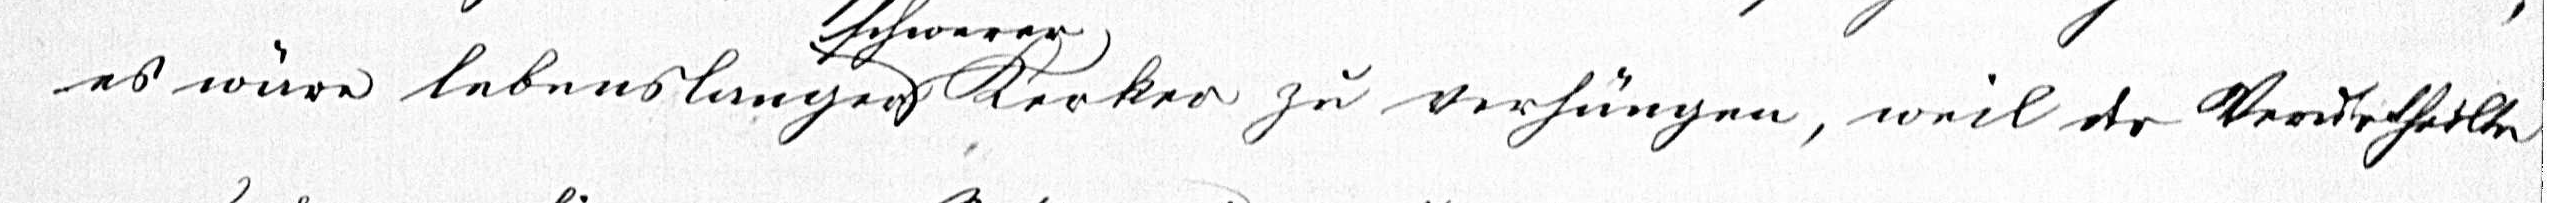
es wäre lebenslanger Kerker zu verhängen, weil der Verurtheilte
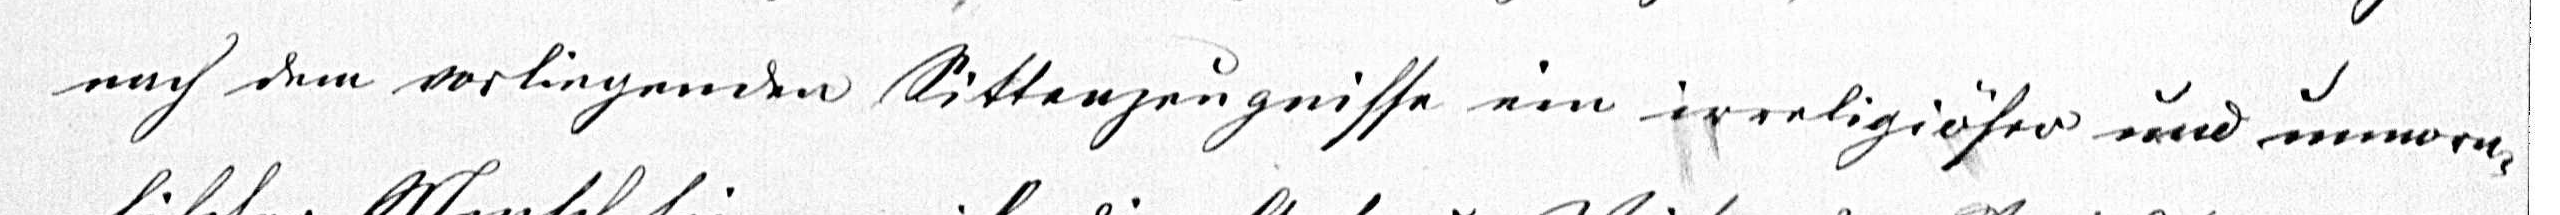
nach dem vorliegenden Sittenzeugnisse ein irreligiöser und unmora¬
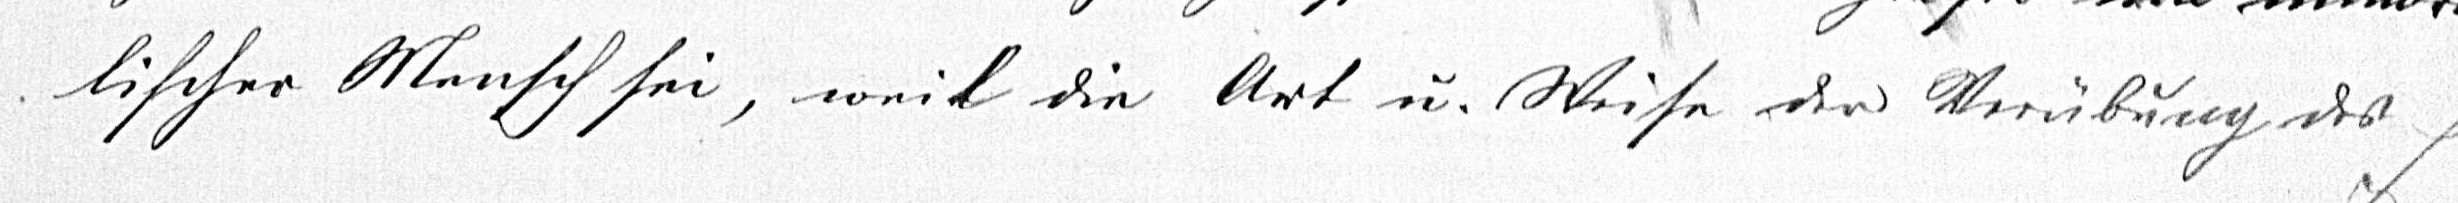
lischer Mensch sei, weil die Art u. Weise der Verübung des
